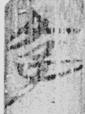韋（回）
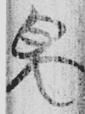蜀（獨）
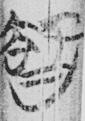智（知）
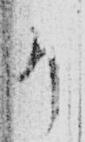人
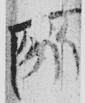所
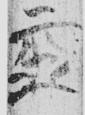亞（惡）
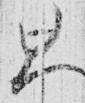也
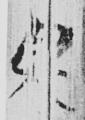蜀（獨）
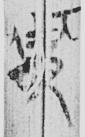貴
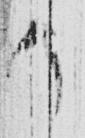人
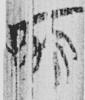所
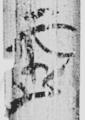亞（惡）
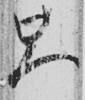也
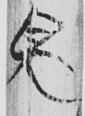蜀（獨）
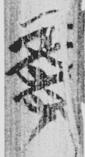○（富）
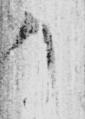人
